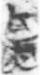聶（攝）
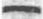一
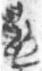○（貂）
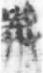與
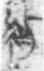紫
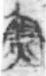魚
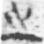之
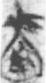○（箙）
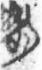○（絶）
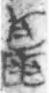聶（攝）
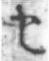屯
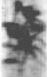○（纁）
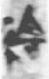○（組）
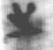之
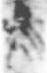綏
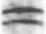二
